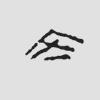{文一}
